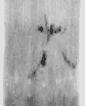{十八}
